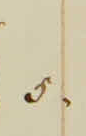5
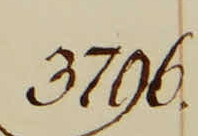3796.
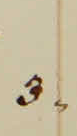3
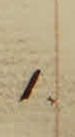1
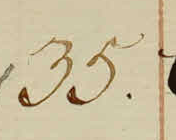35.
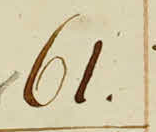61.
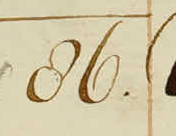86.
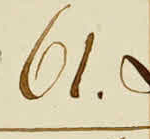61.
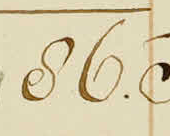86.
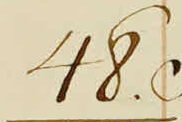48.
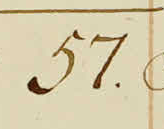57.
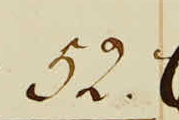52.
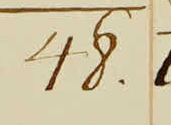48.
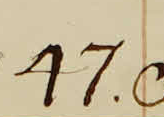47.
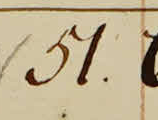51.
